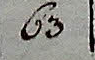63
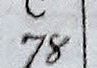78
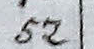52
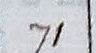71
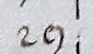29
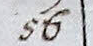56
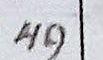49
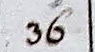36
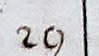29
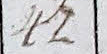42
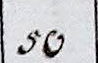50
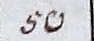50
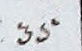35
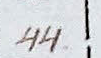44
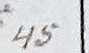45
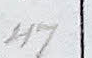47
